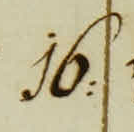16:
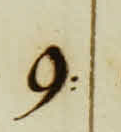9:
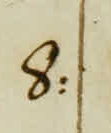8:
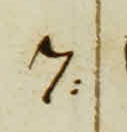7:
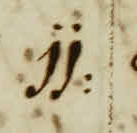11:
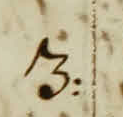3:
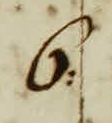6:
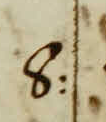8:
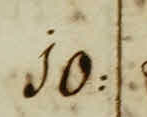10:
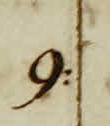9:
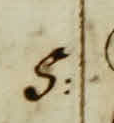5.
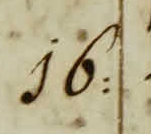16:
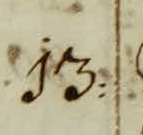13:
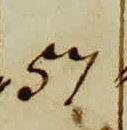57
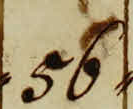56
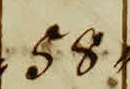58
